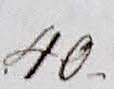40
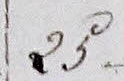25
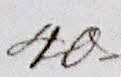40
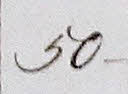50
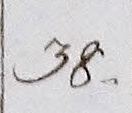38
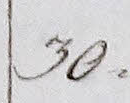30
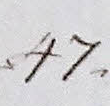47
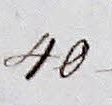40
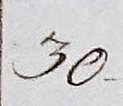30
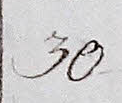30
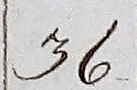36
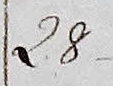28
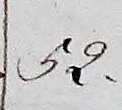52
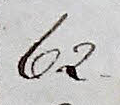62
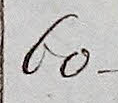60
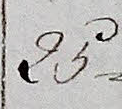25
